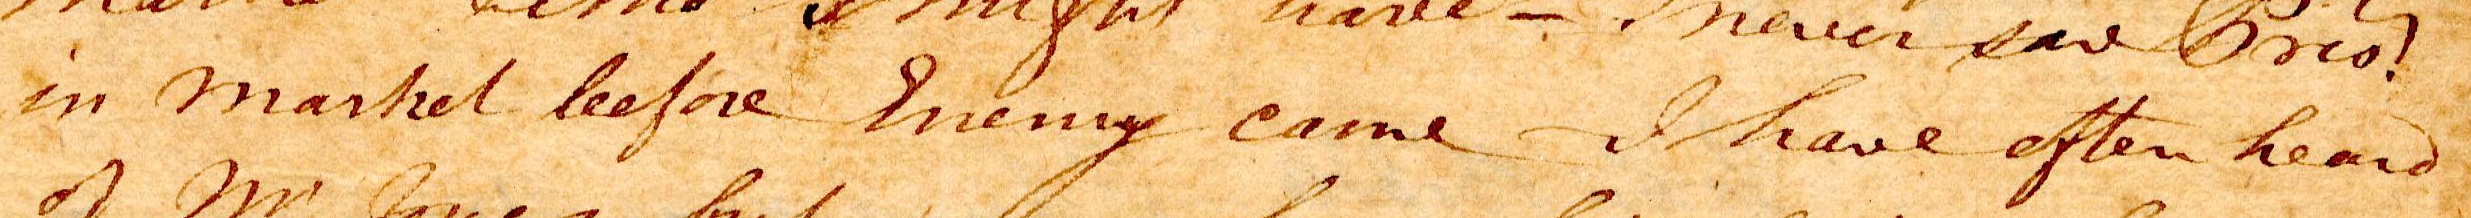in Market before Enemy came I have often heard
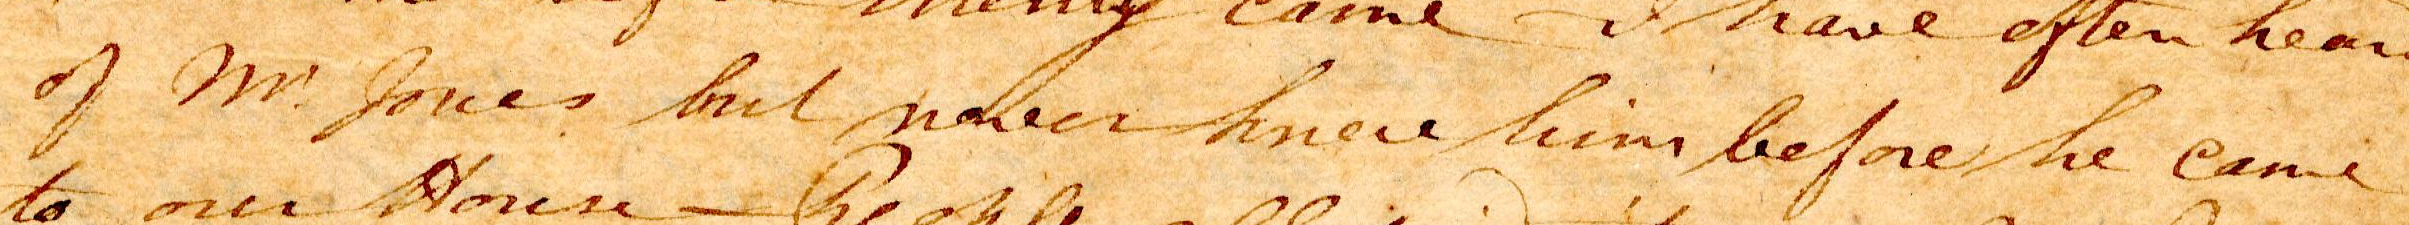of M^r Jones but never knew him before he came
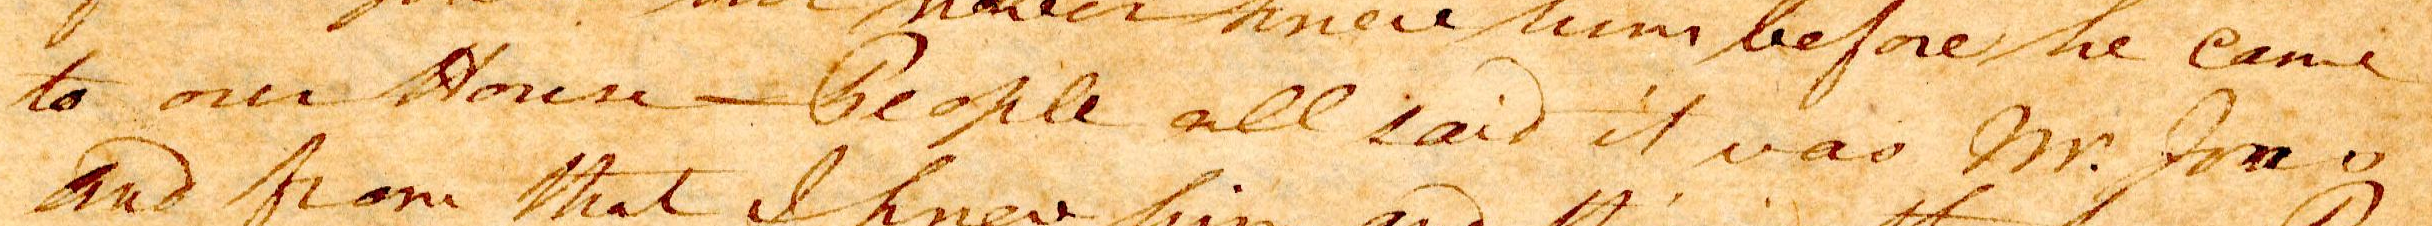to our House- People all said it was M^r. Jones
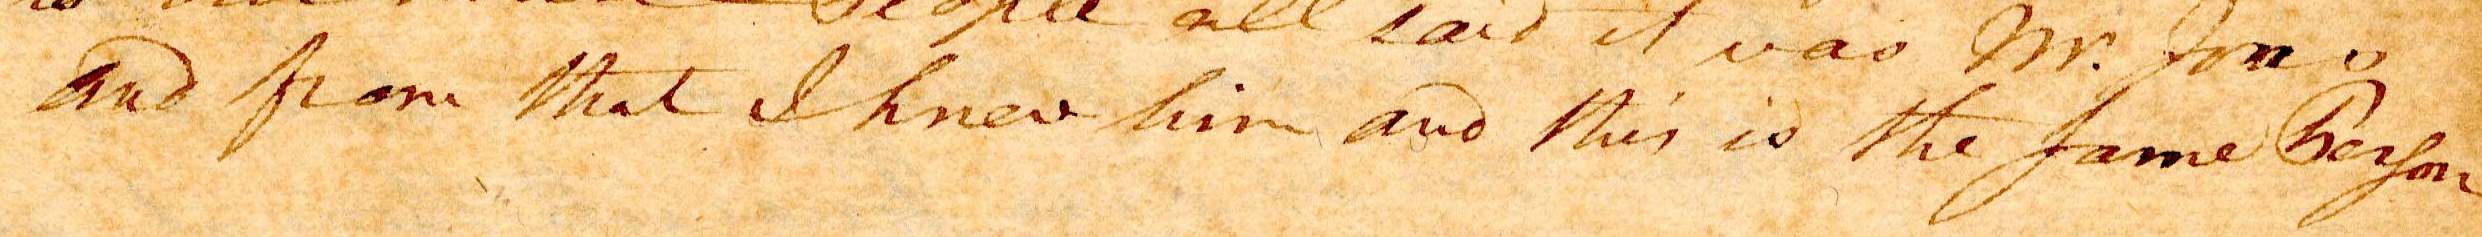and from that I knew him and this is the same Person
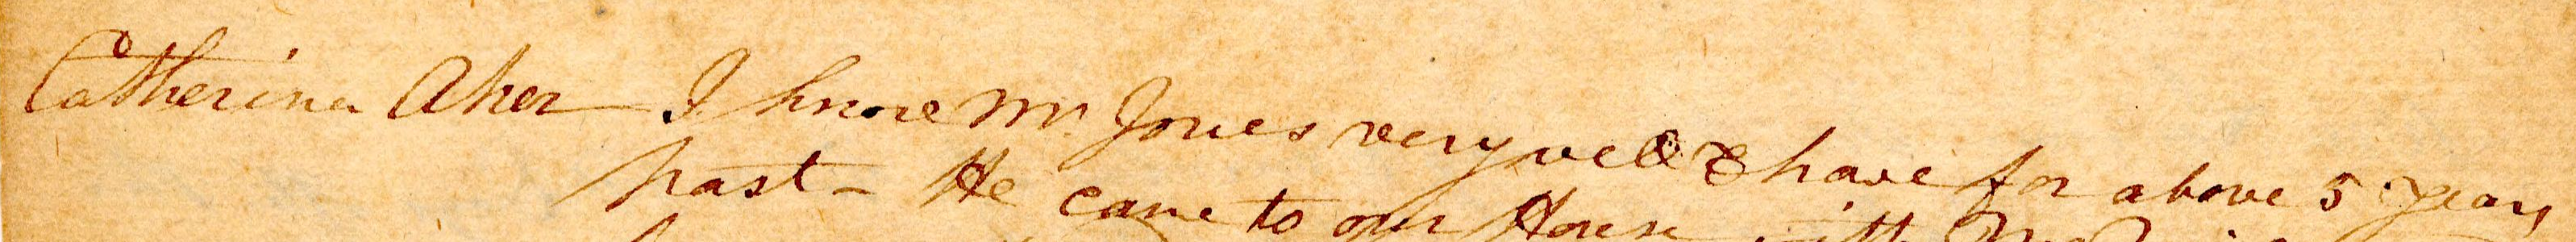Catherine Aker I knew M^r. Jones very well & have for above 5 years
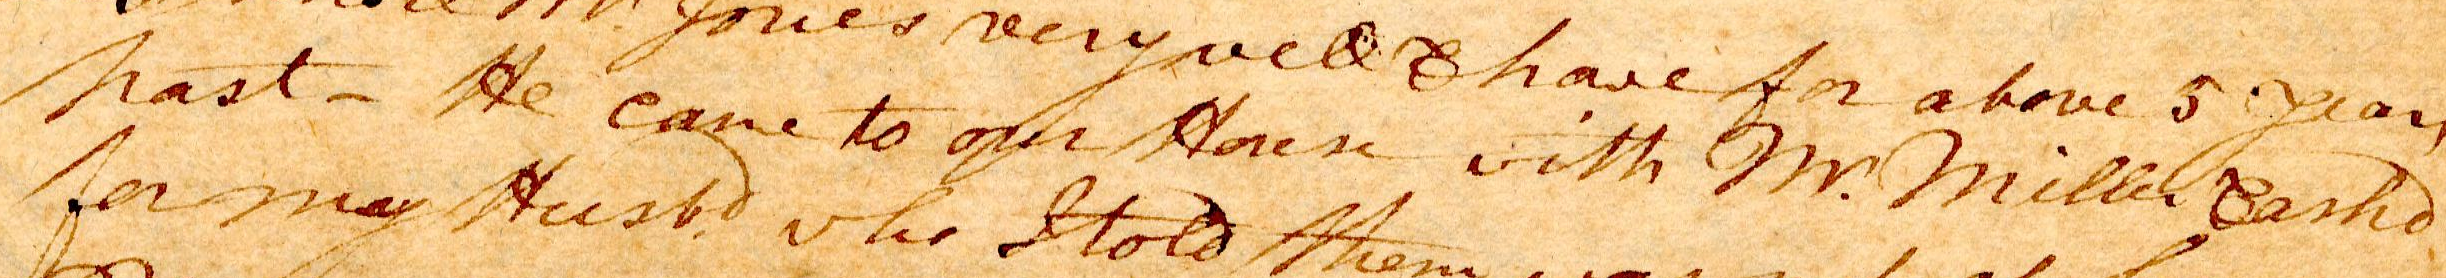past. He came to our House with M^r Miller, called
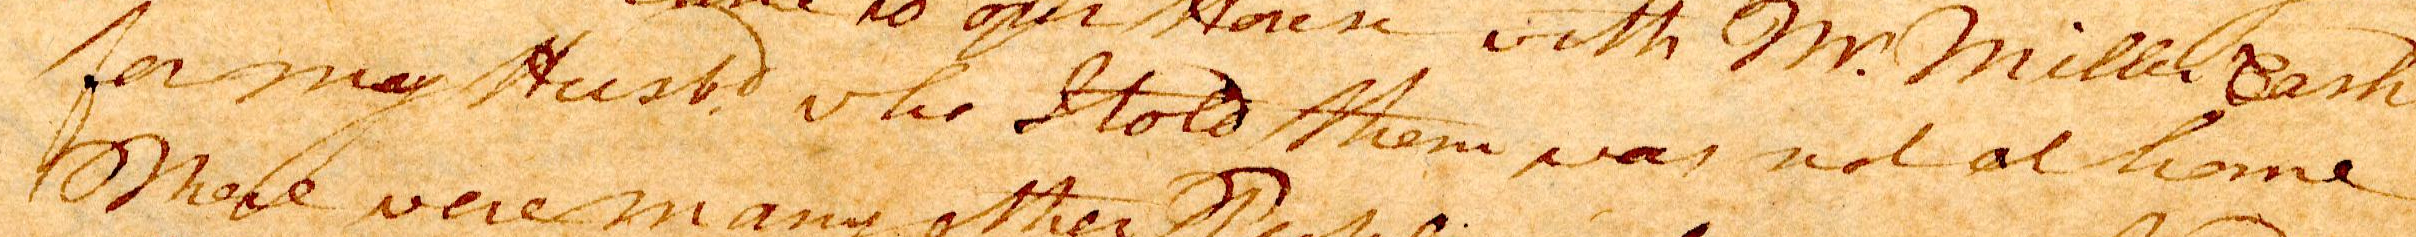for my Husb^d who I told them was not at home
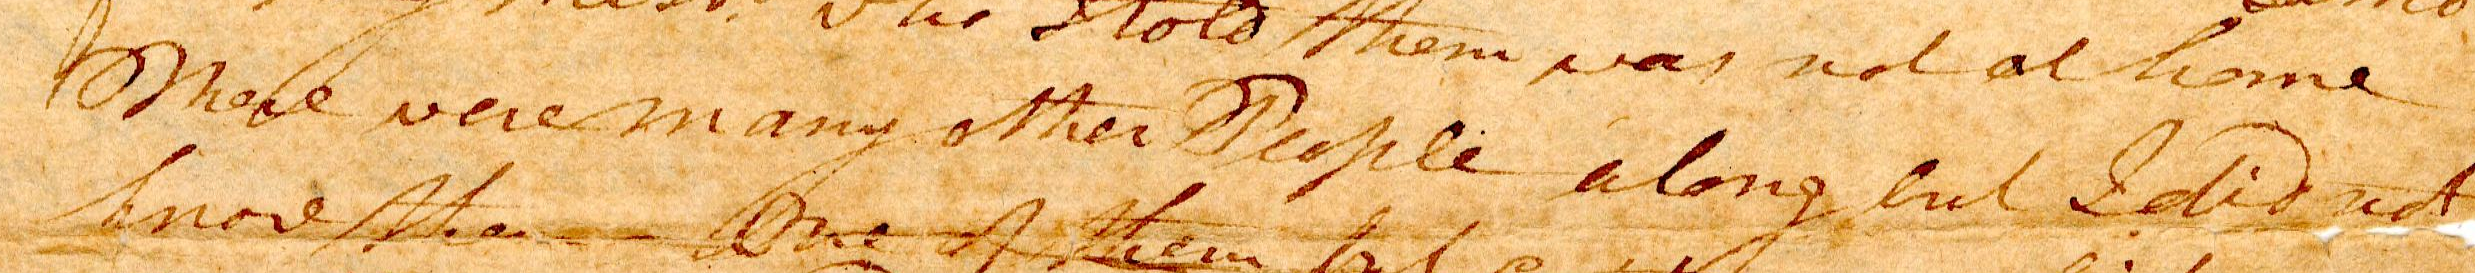There were many other People along but I did not
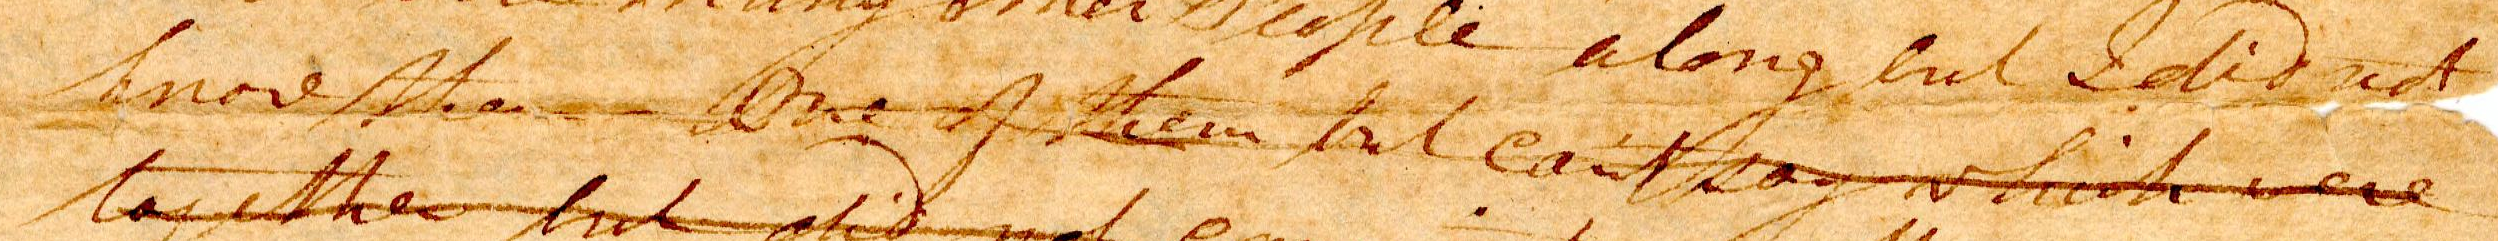know the one of them but can't say which were
